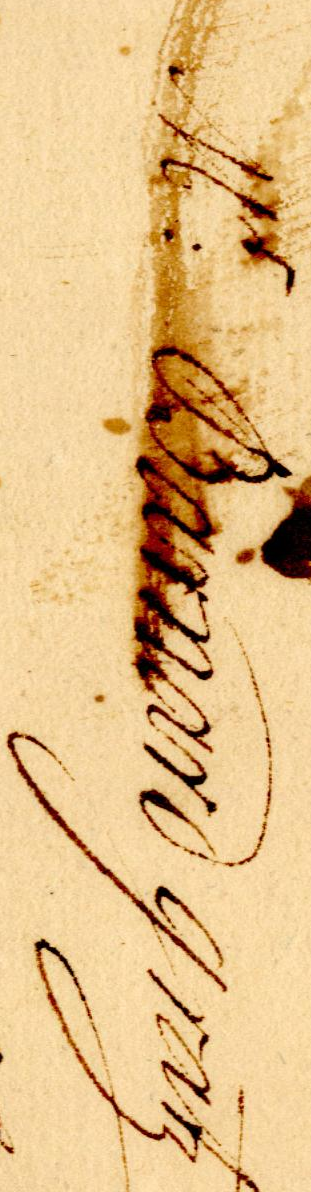M^r Barnard Gratz
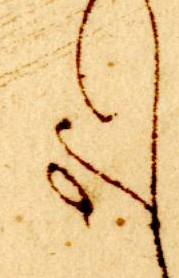To
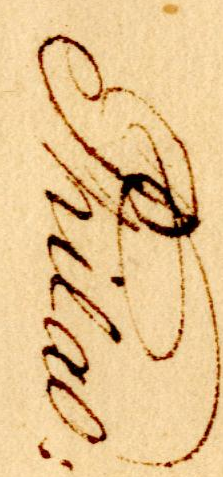Philad:
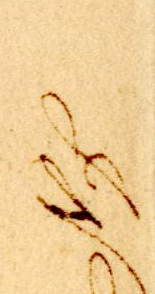In
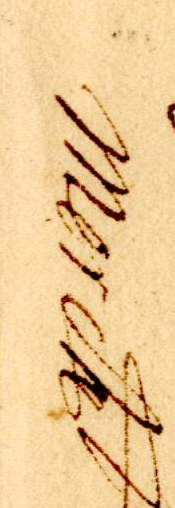Merch^t
